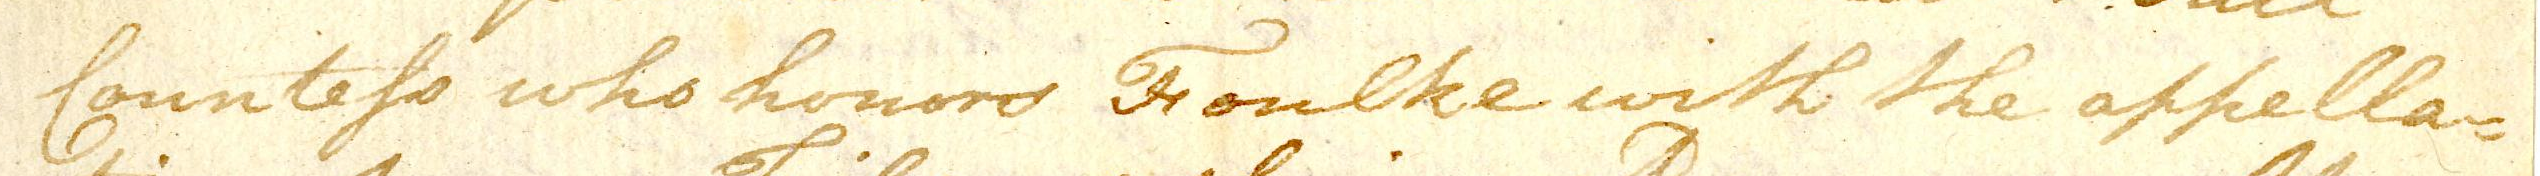Countess who honors Foulke with the appella-
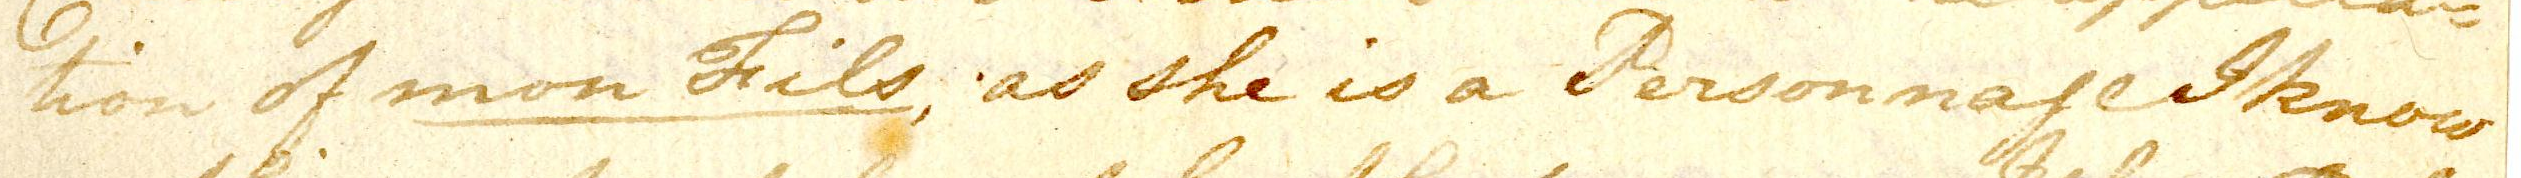tion of mon Fils; as she is a Personnage I know
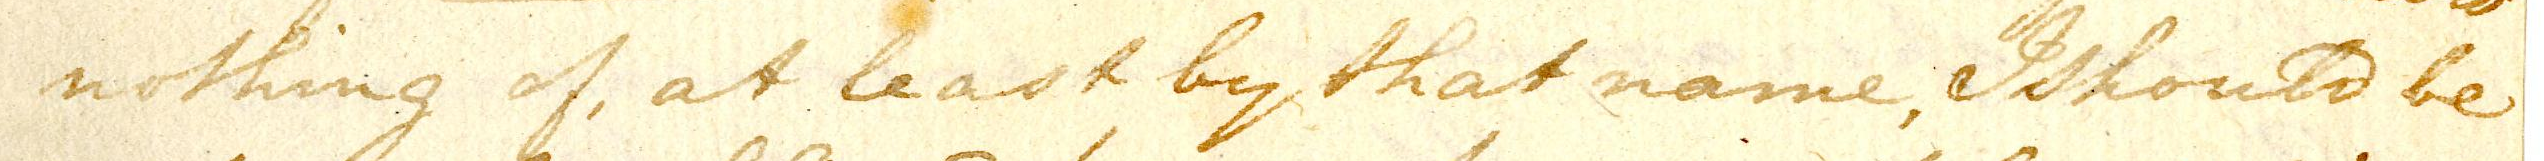nothing of, at least by that name, I should be
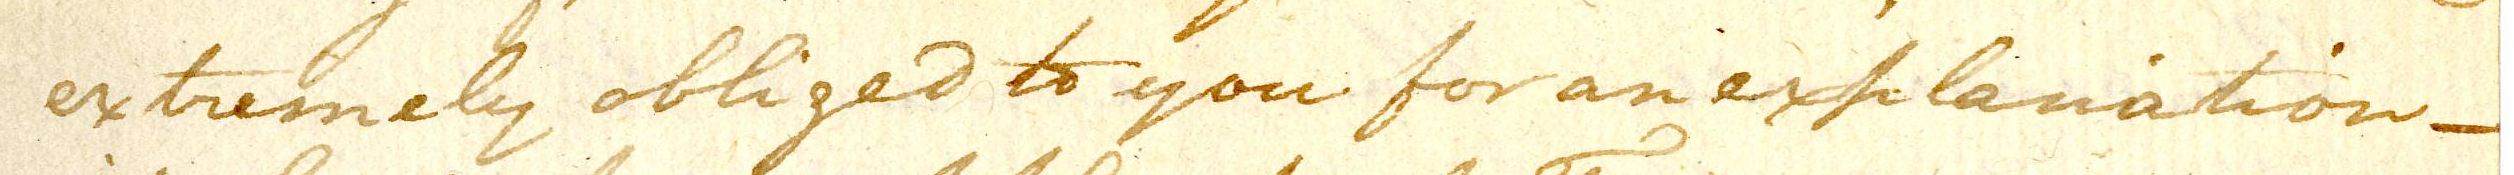extremely obliged to you for an explanation-
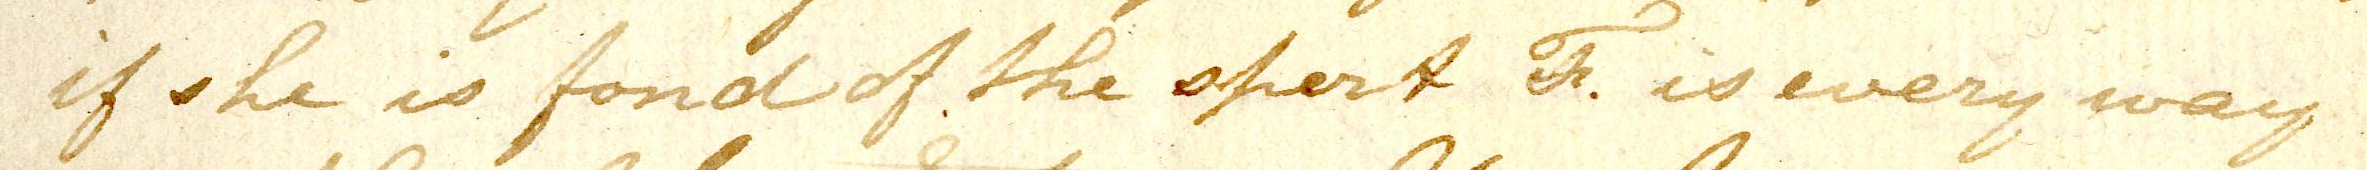if she is fond of the sport F. is every way
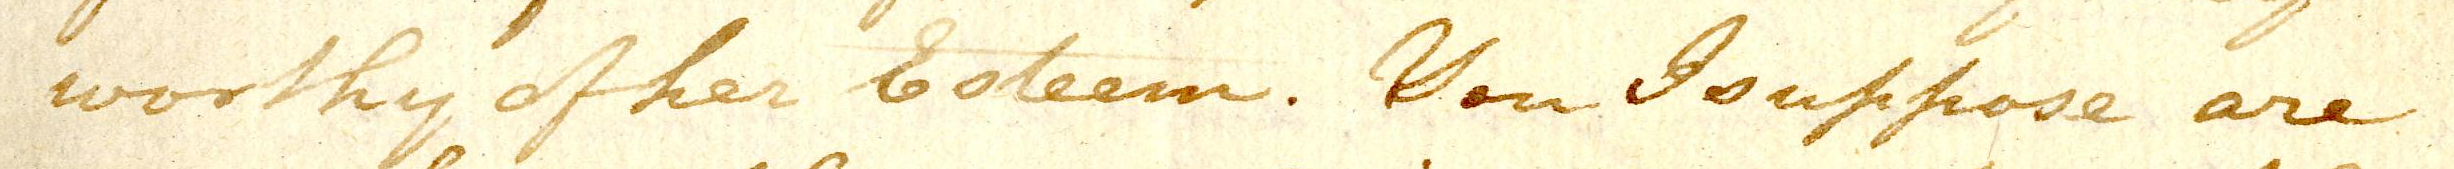worthy of her Esteem. You I suppose are
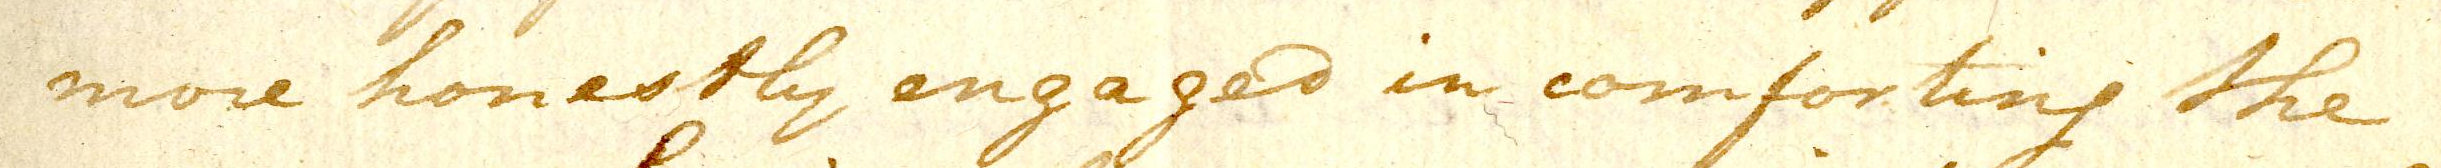more honestly engaged in comforting the
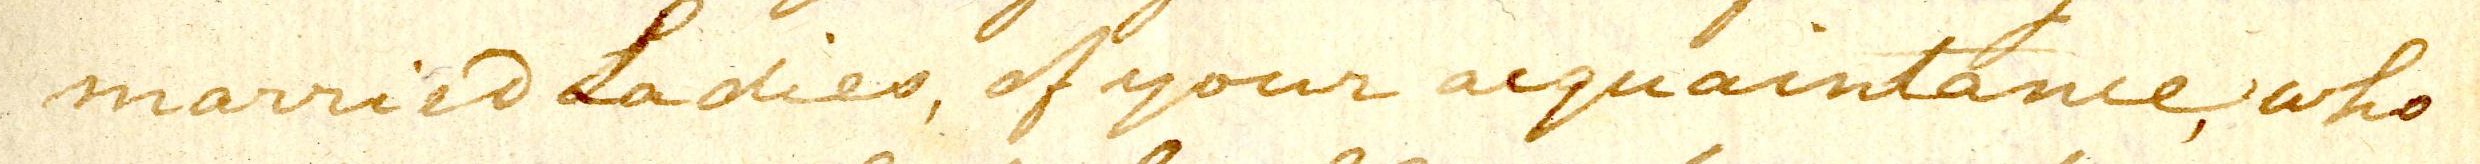married Ladies, of your acquaintance, who
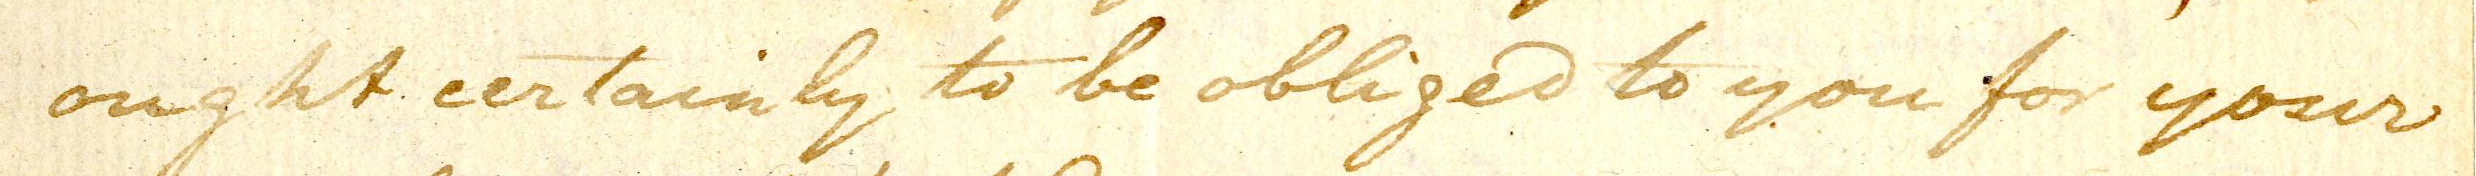ought certainly to be obliged to you for your
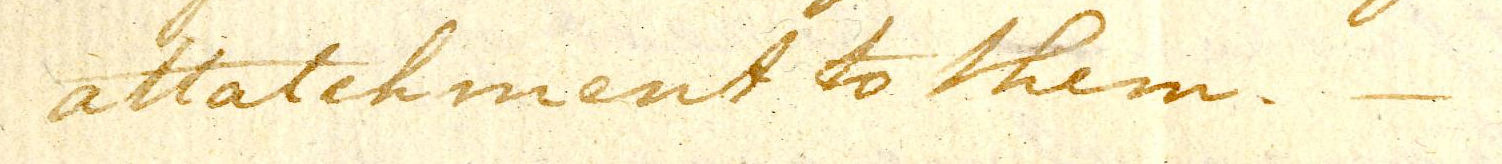attachment to them.-
